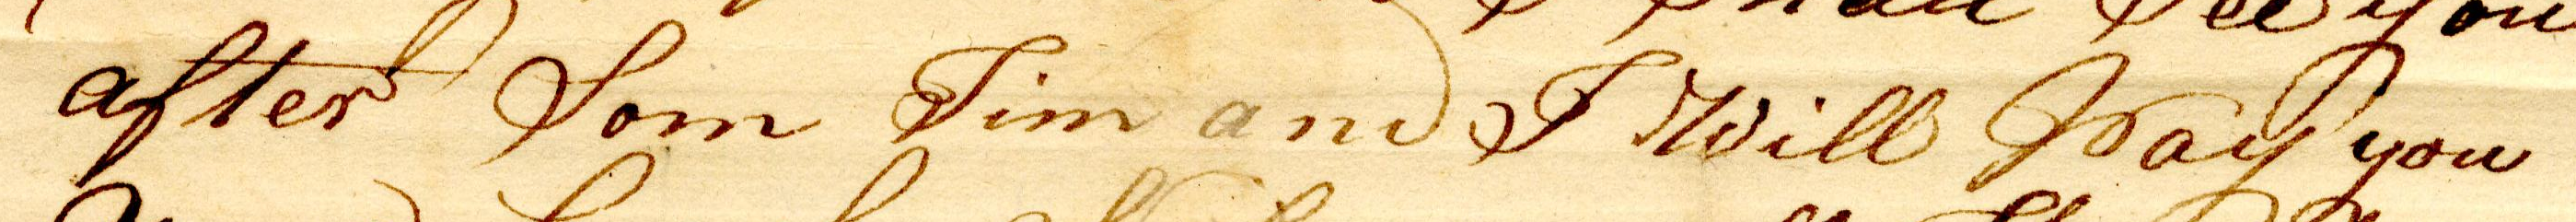after Som Tim and I Will pay you
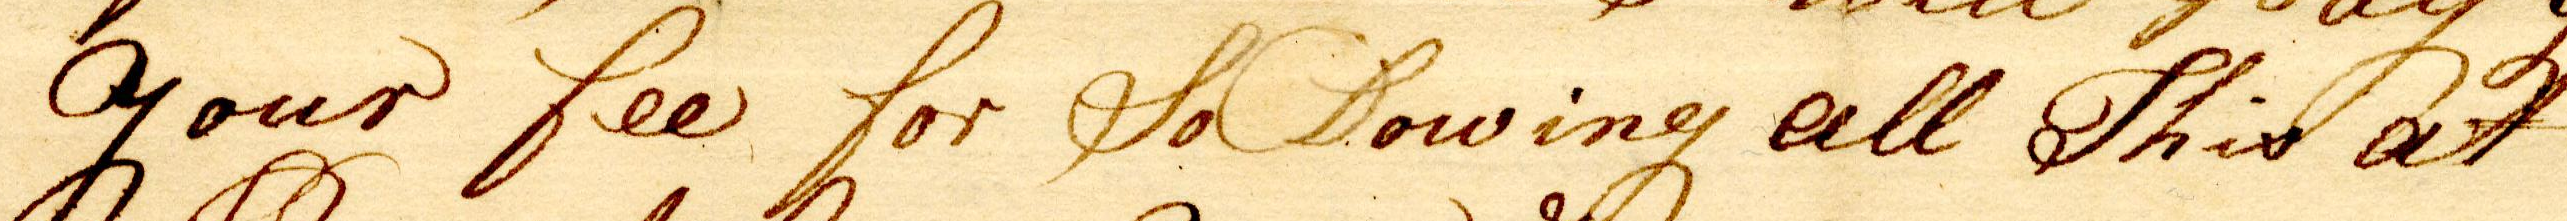Your fee for So Dowing all This at
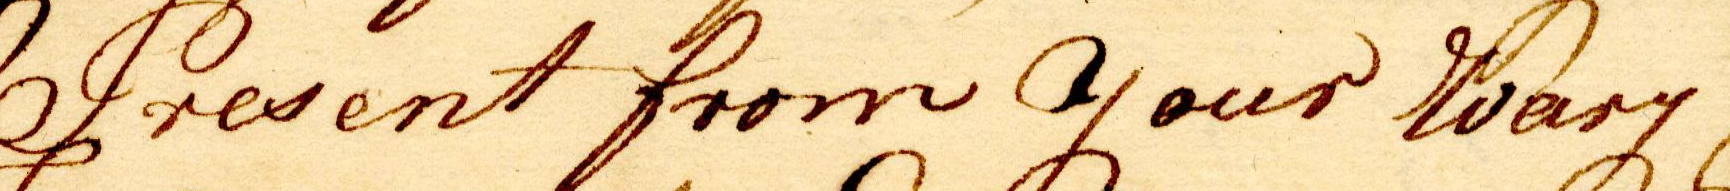Present from Your Wary
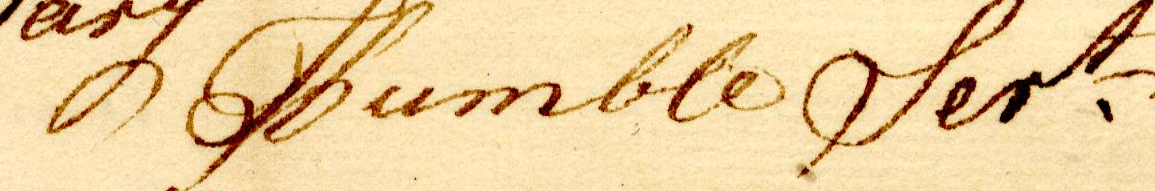Humble Ser^t
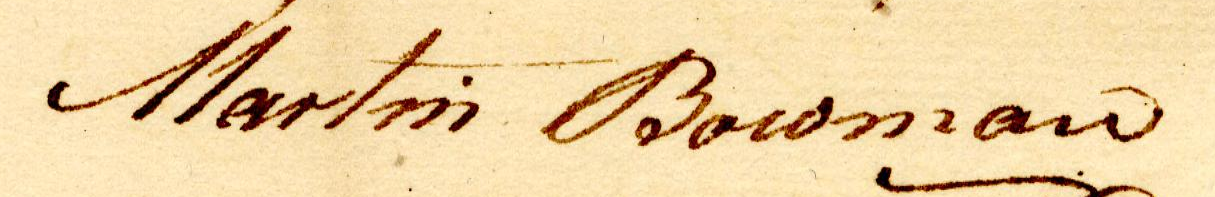Martin Bowman
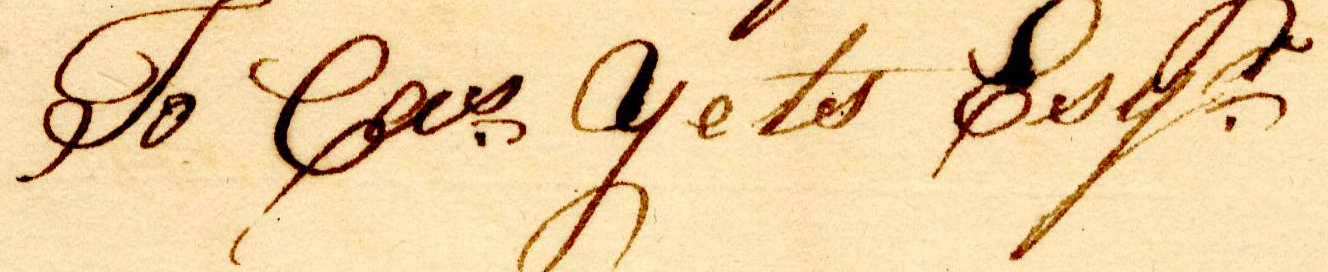To Cas. Yetes Esq^r
